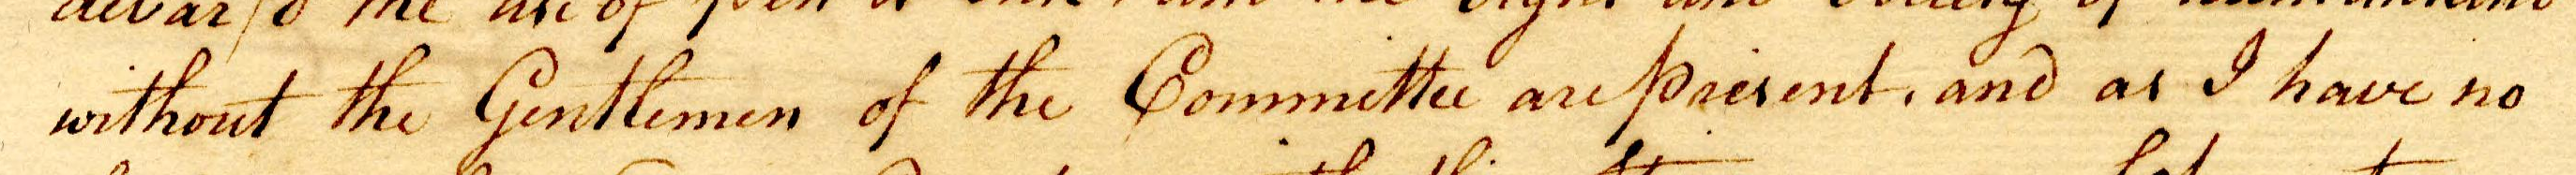without the Gentlemen of the Committee are present, and as I have no
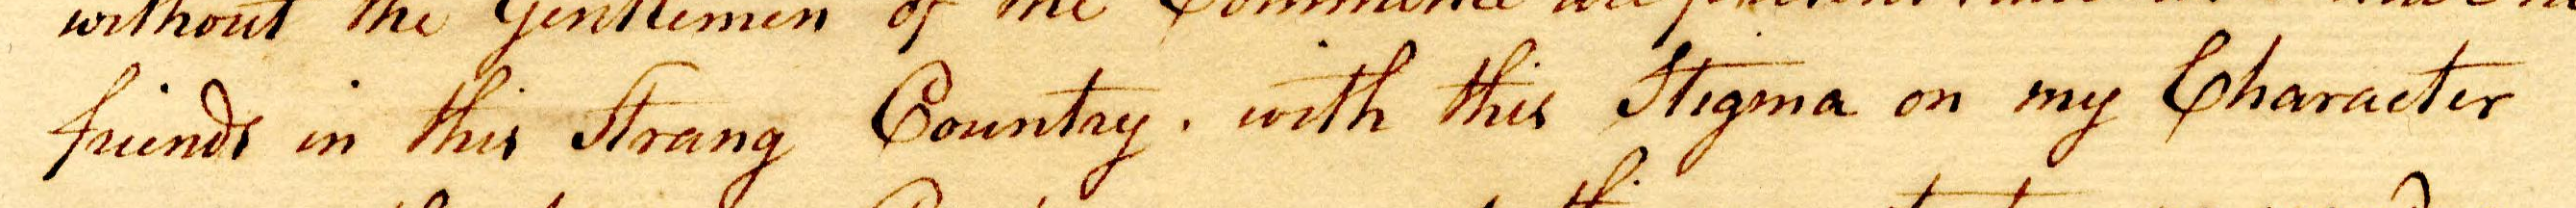friends in this Strang Country with this Stigma on my Character
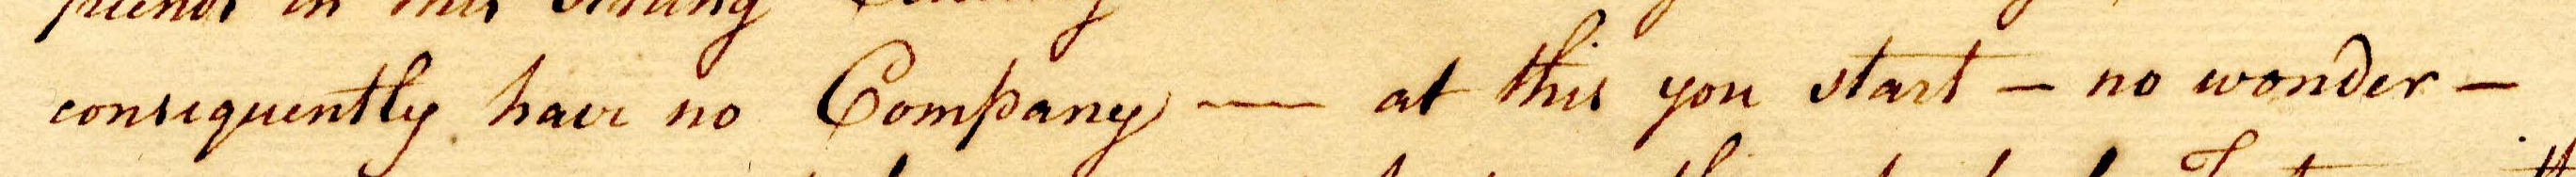consequently have no Company. at this you start. no wonder.
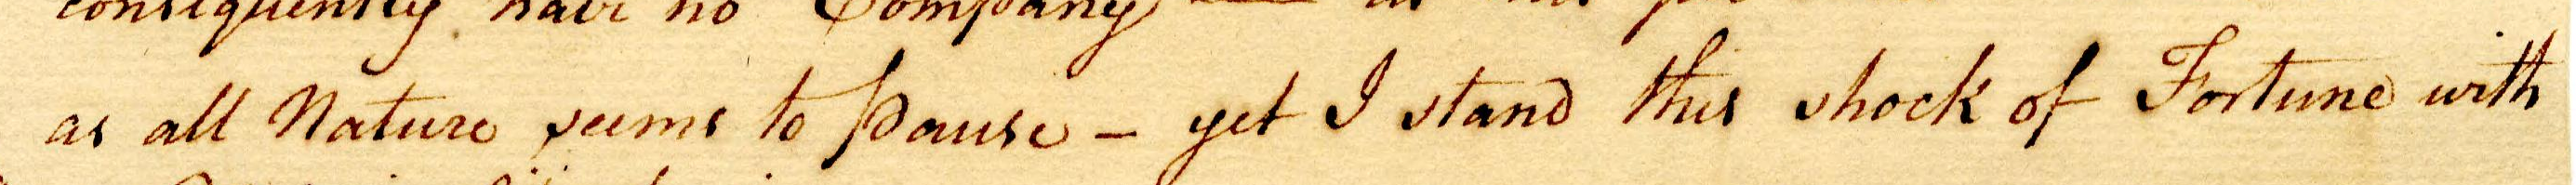as all Nature seems to pause, yet I stand this shock of Fortune with
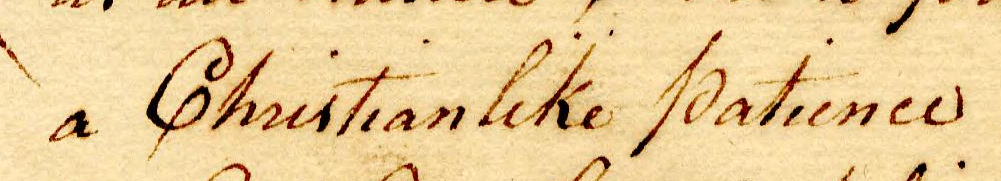a Christianlike Patience
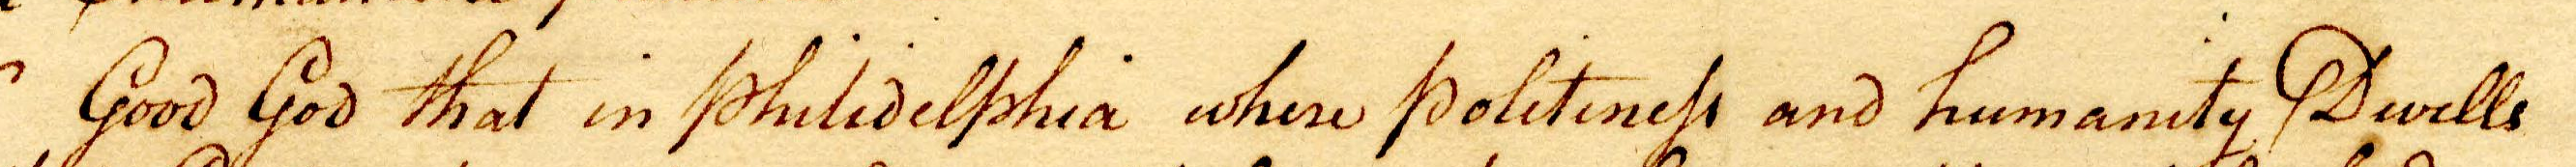Good God that in Philidelphia where politeness and humanity Dwells
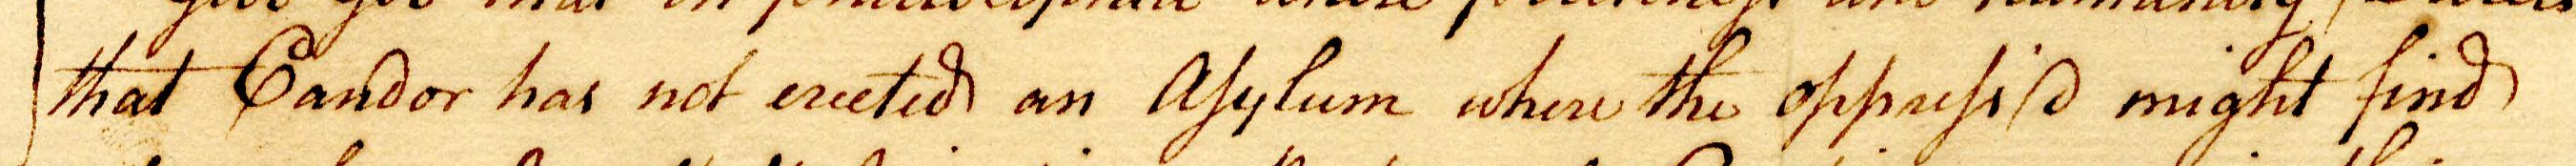that Candor has not erected an Asylum where the oppress'd might find
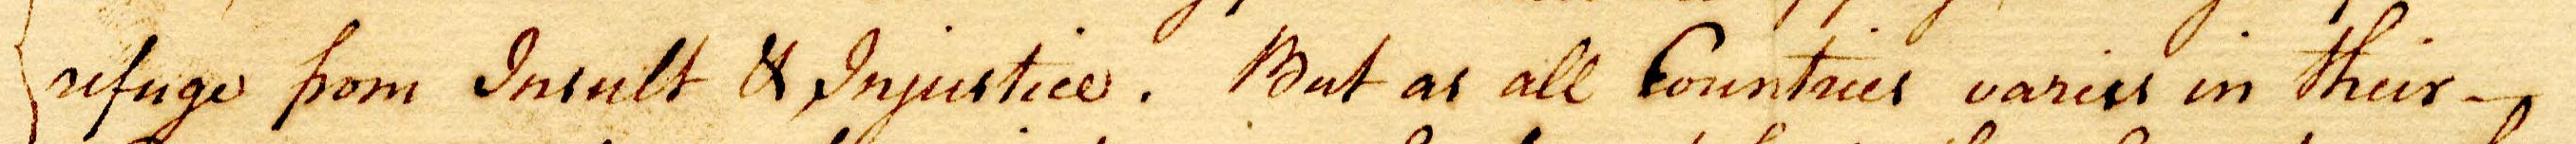refuge from Insult & Injustice. But as all Countries varies in their
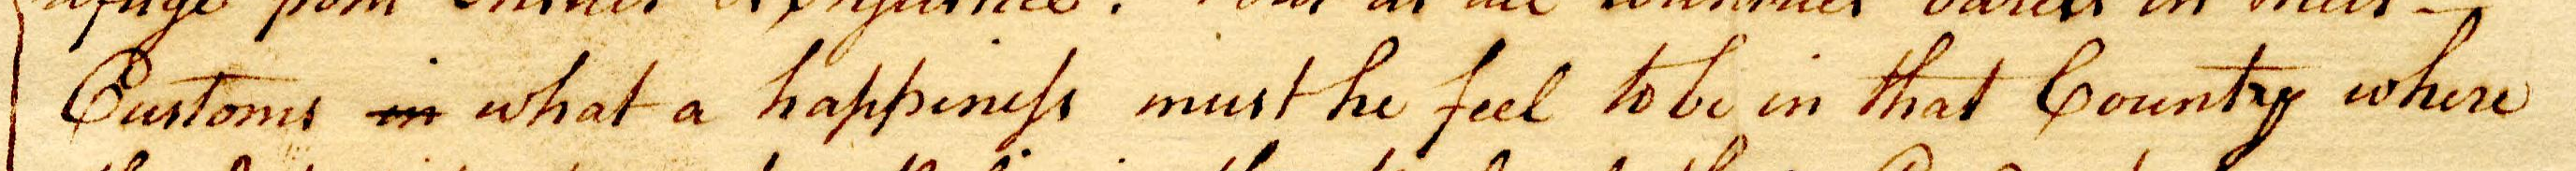Customs in what a happiness must he feel to be in that Country where
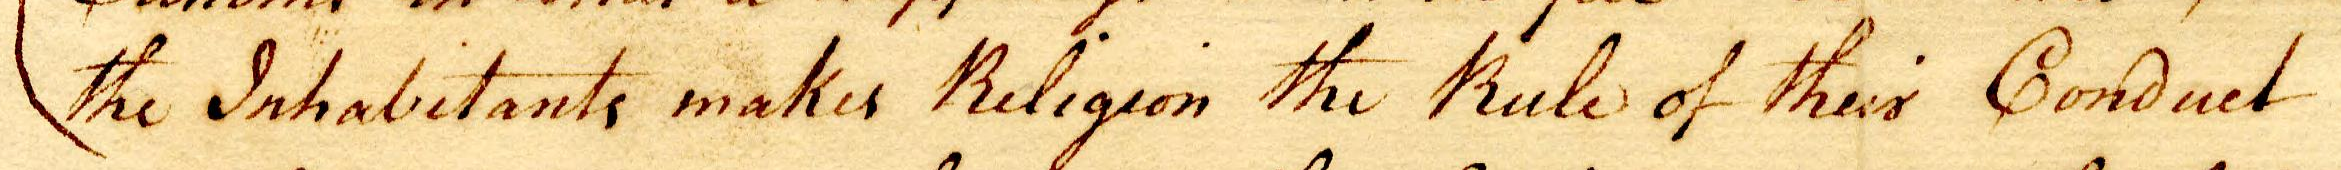the Inhabitants makes Religion the Rule of their Conduct
